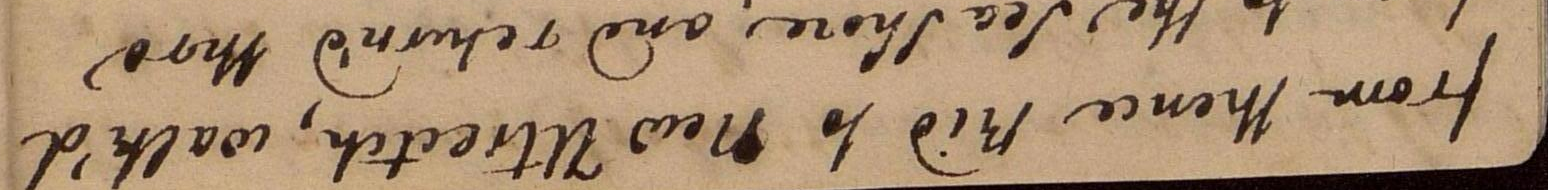from thence Rid to New Utretch, walk'd
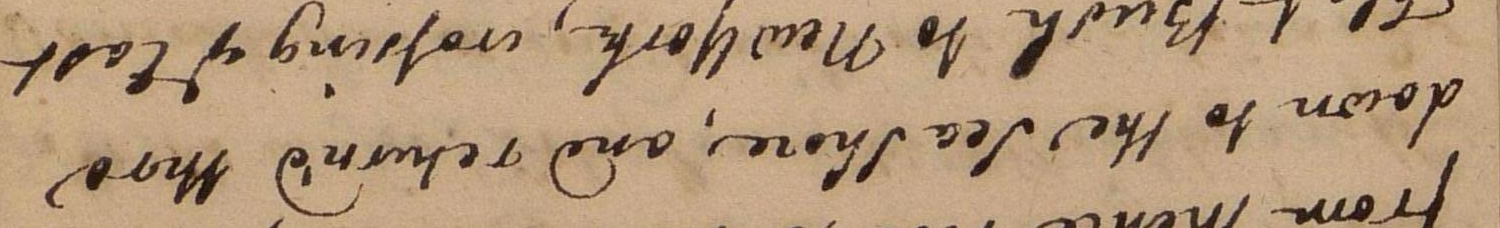down to the Sea Shore, and return'd thro
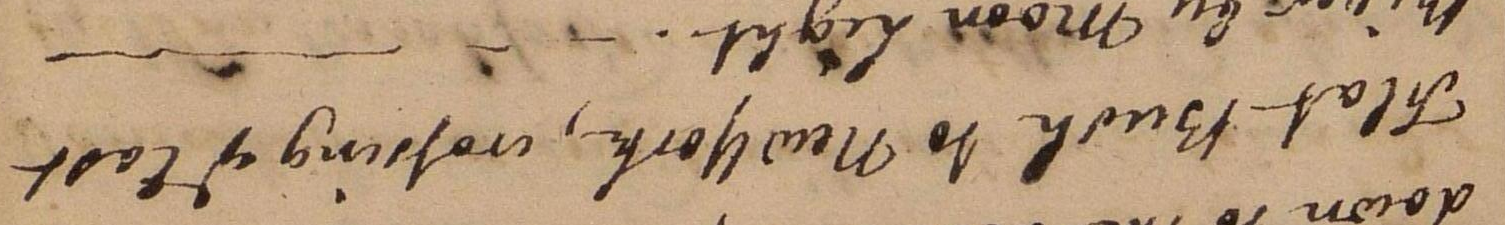Flat Bush to New York, crossing y^e East
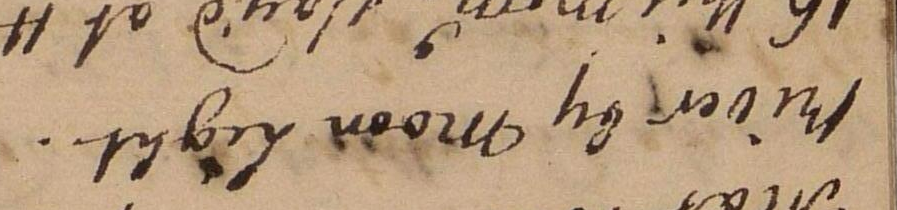River by Moon Light.
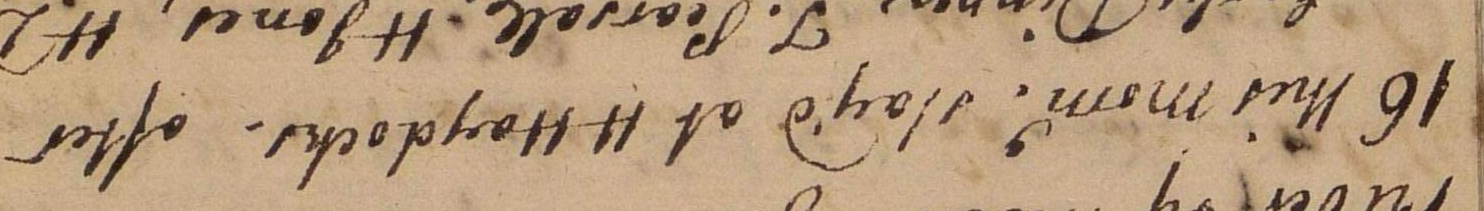16 this morn^g. stay'd at H Haydocks. after
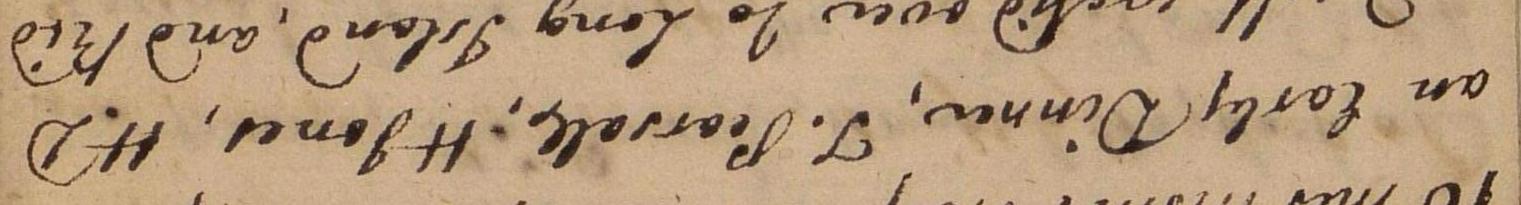an Early Dinner, T. Pearsall, H Jones, HD
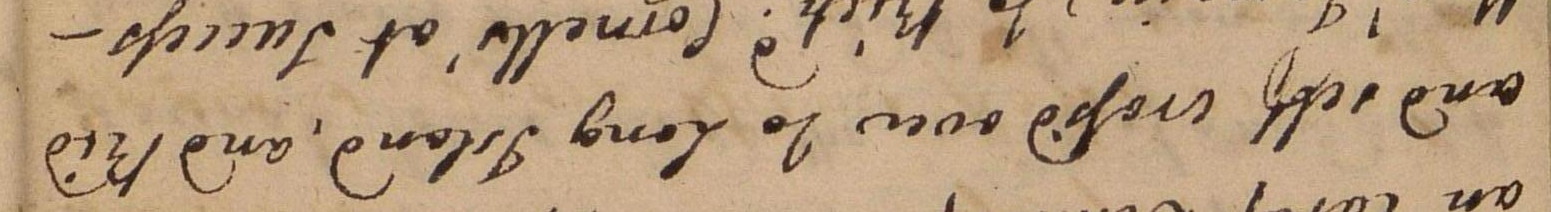and self cross'd over to Long Island, and Rid
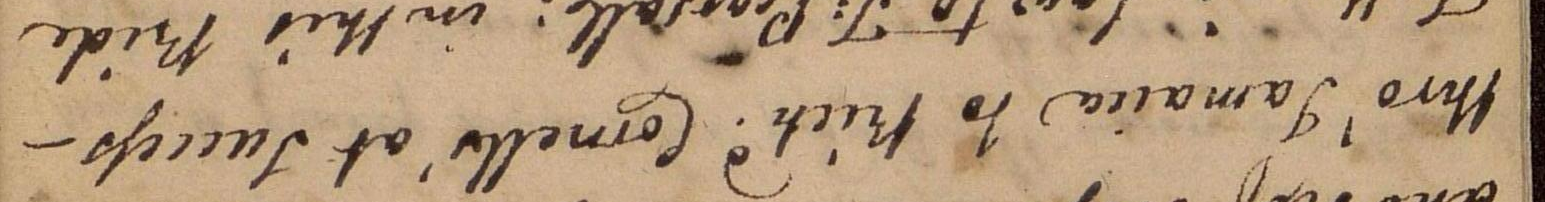thro' Jamaica to Rich^d. Cornells' at Success-
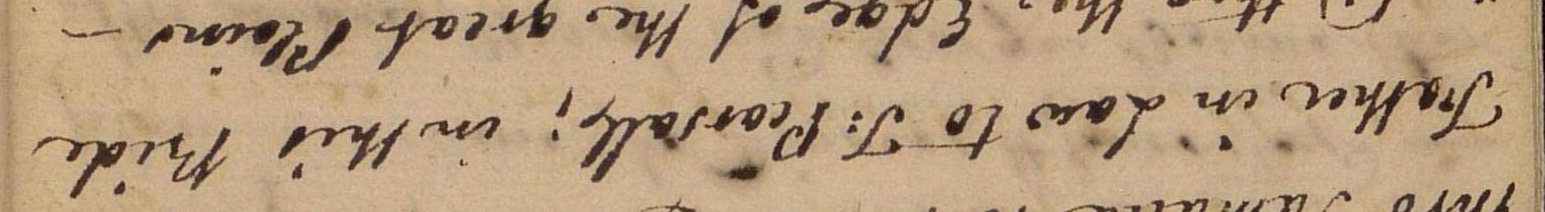Father in Law to T: Pearsall; in the Ride
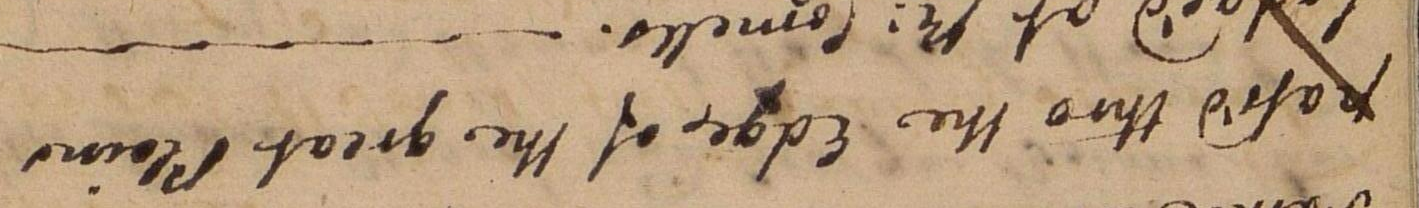pass'd thro the Edge of the great Plains -
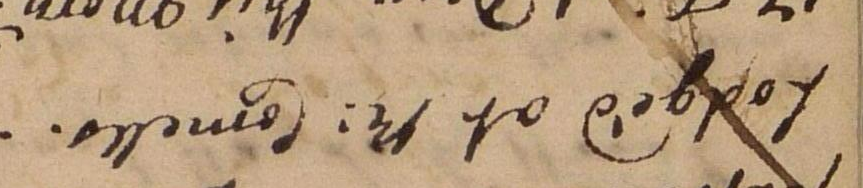Lodge'd at R: Cornells.
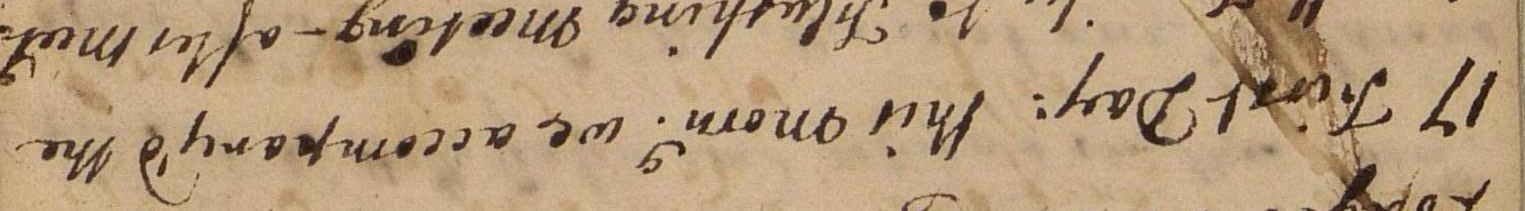17 First Day: this Morn^g. we accompany'd the
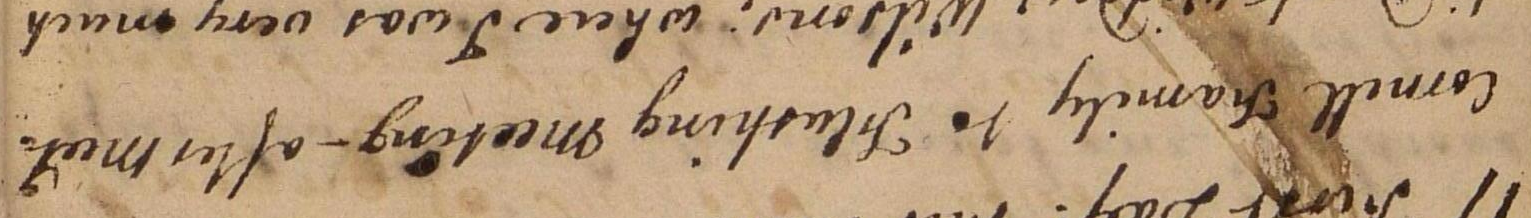Cornell Family to Flushing Meeting - after meet^g
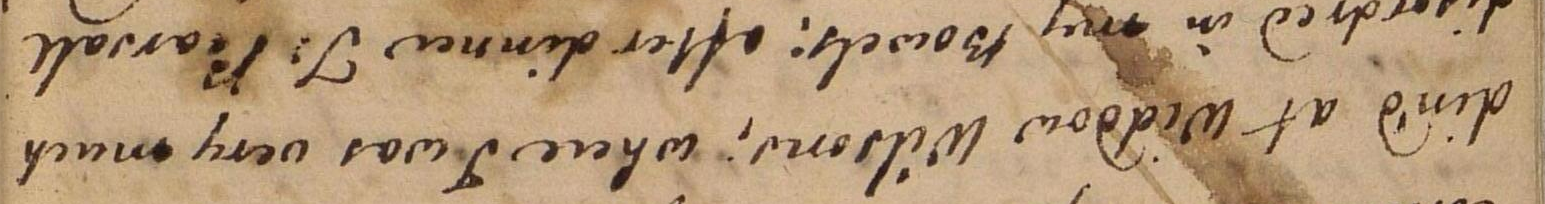din'd at Widdow Wilsons, were I was very much
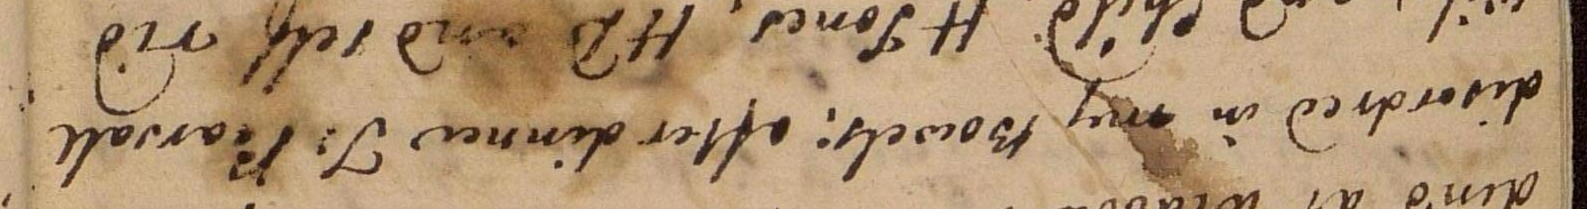disordred in my Bowels: after dinner T: Pearsall
